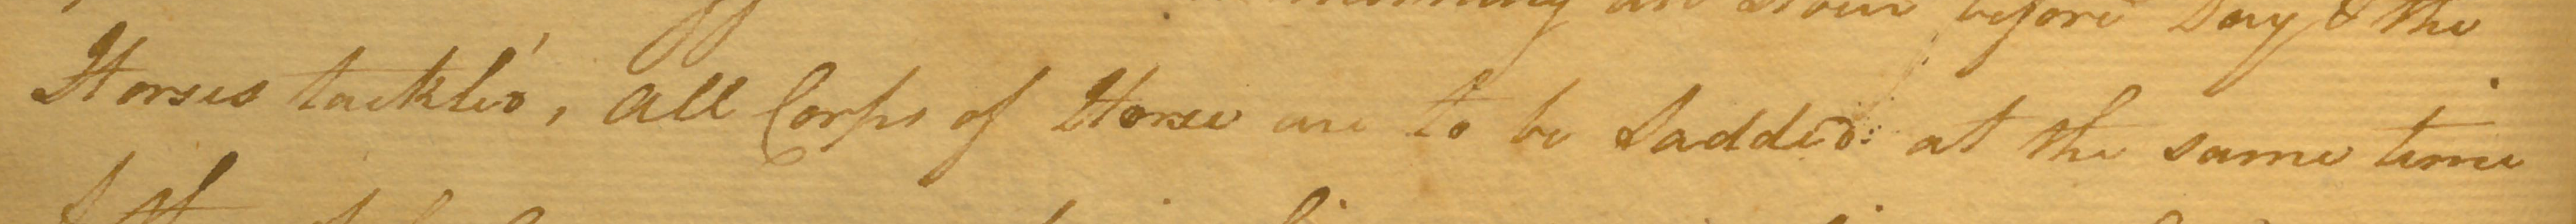Horses tackl'd, all Corps of Horse are to be Saddld at the same time
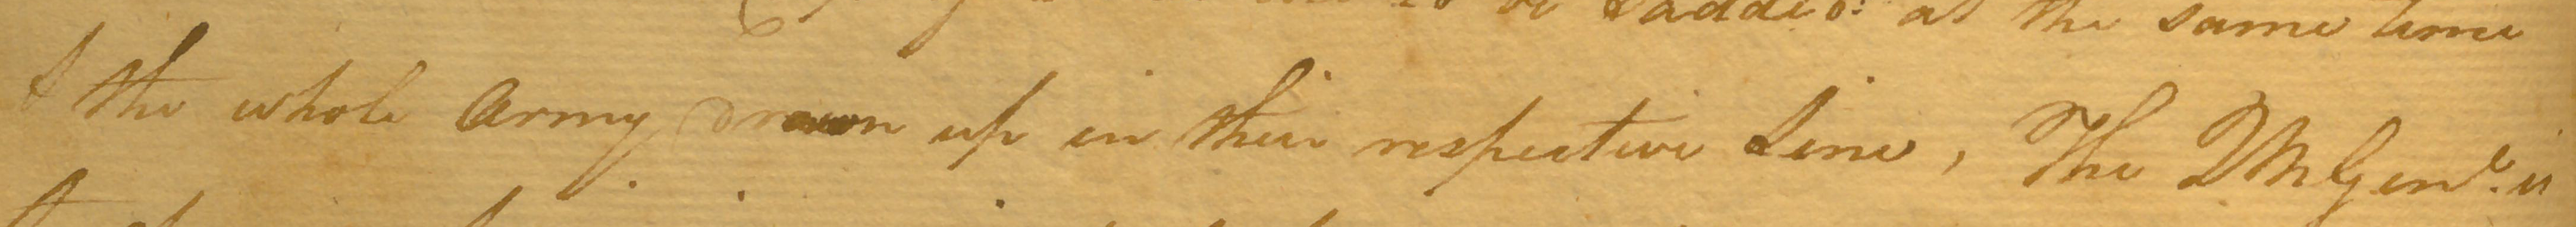& the whole Army drawn up in their respective Lines, The Q M Gen^l. is
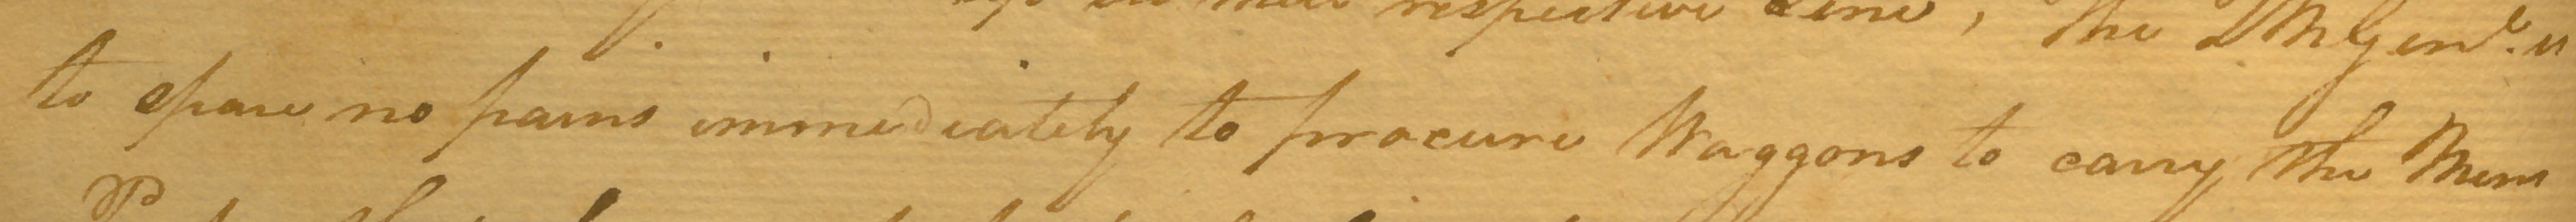to spare no pains immediately to procure Waggons to carry the Mens
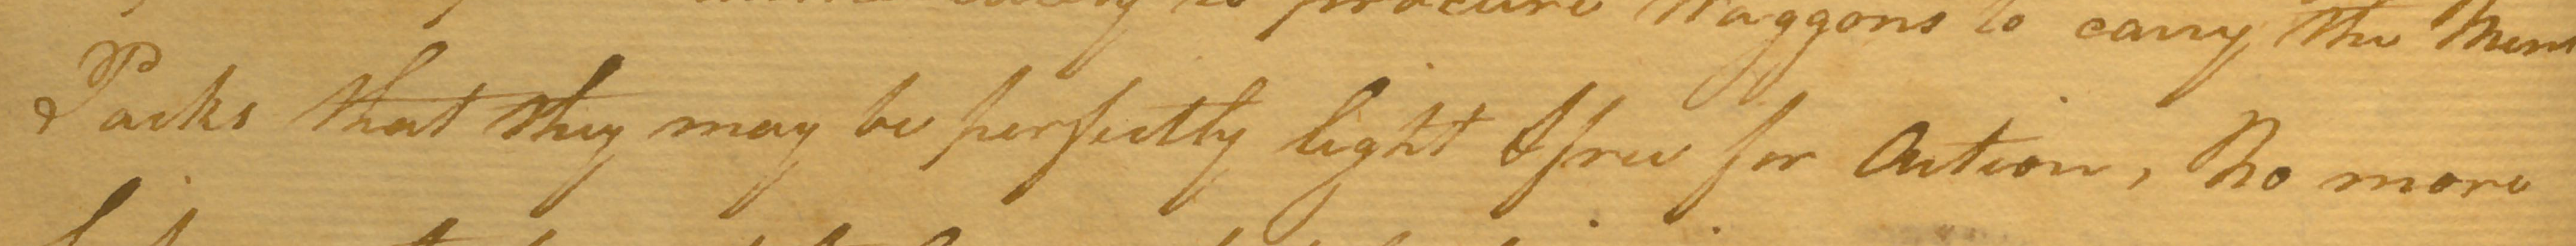Packs that they may be perfectly light & free for Action, No more
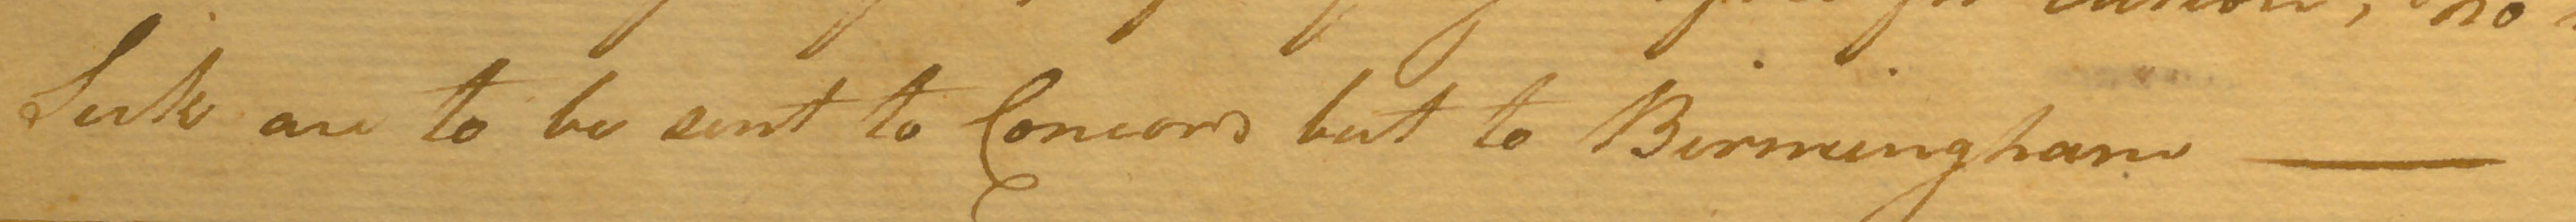Sick are to be sent to Concord but to Birmingham-
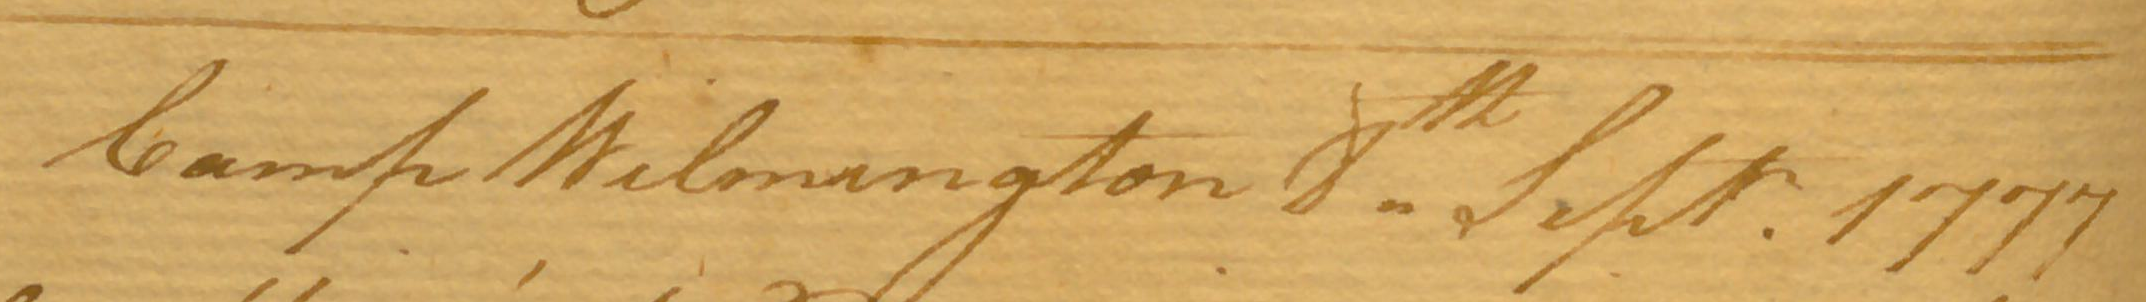Camp Wilmington 8^th. Sept^r. 1777
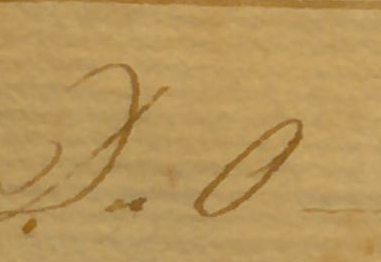D.O-
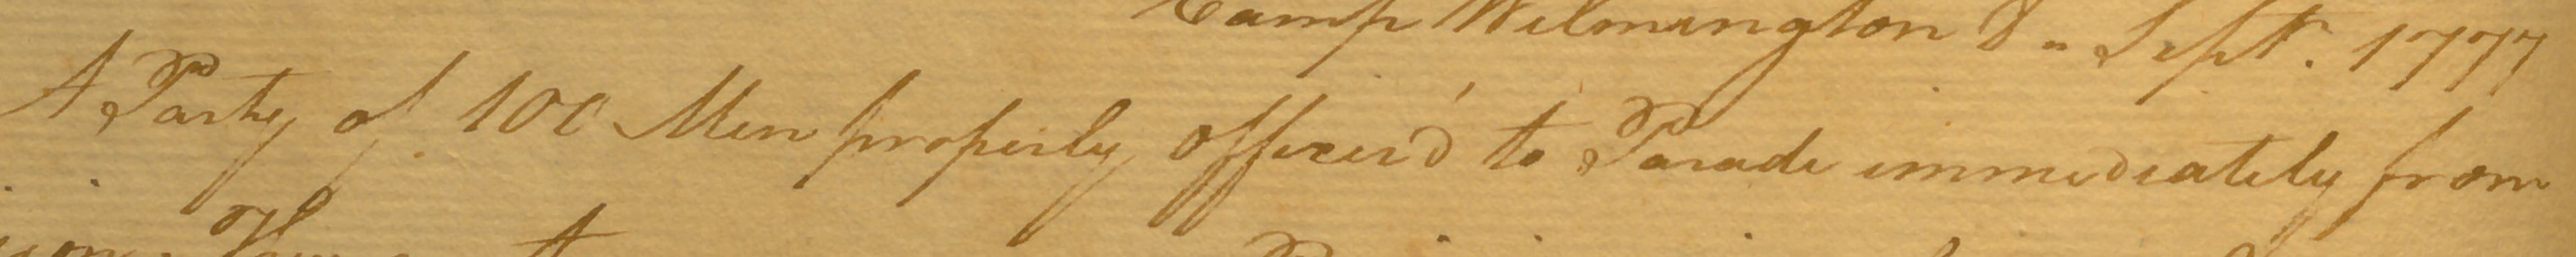A Party of 100 Men properly officer'd to Parade immediately from
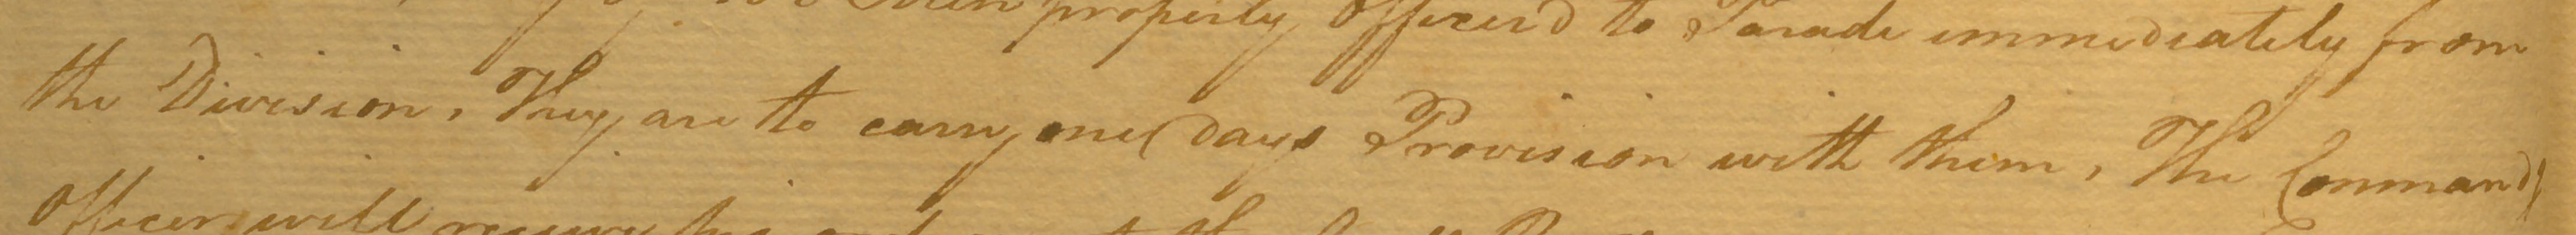the Division. They are to carry one days Provision with them, The Command^g
